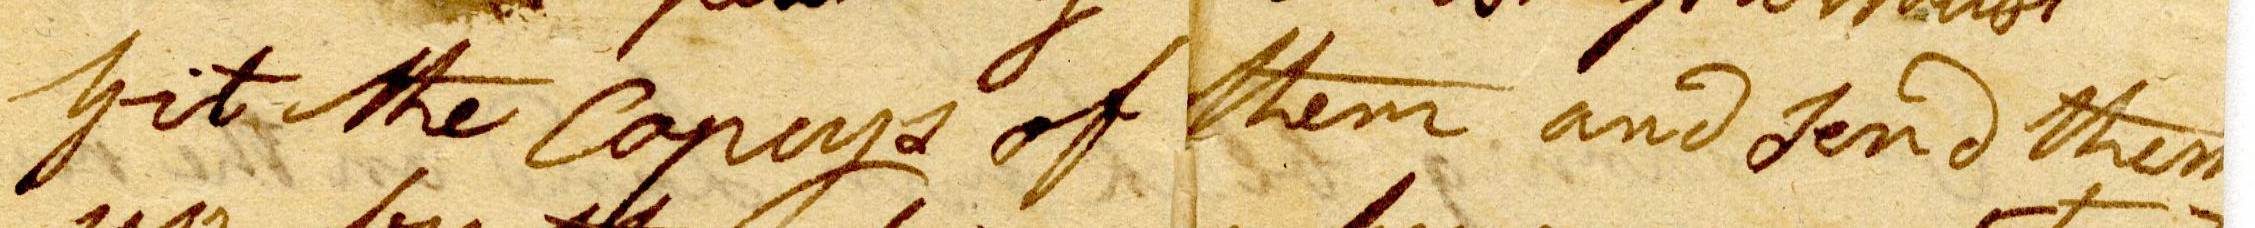git the Copys of them and send them
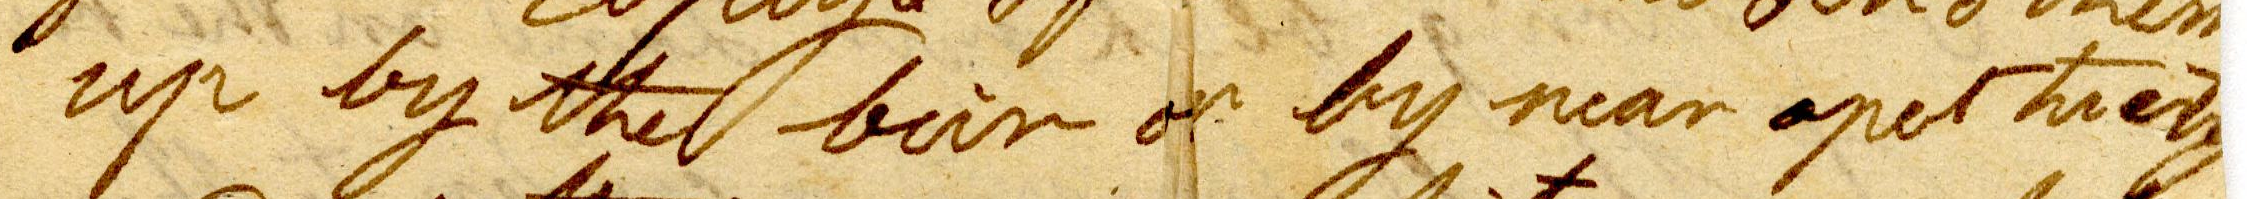up by the beir of by near opertunety
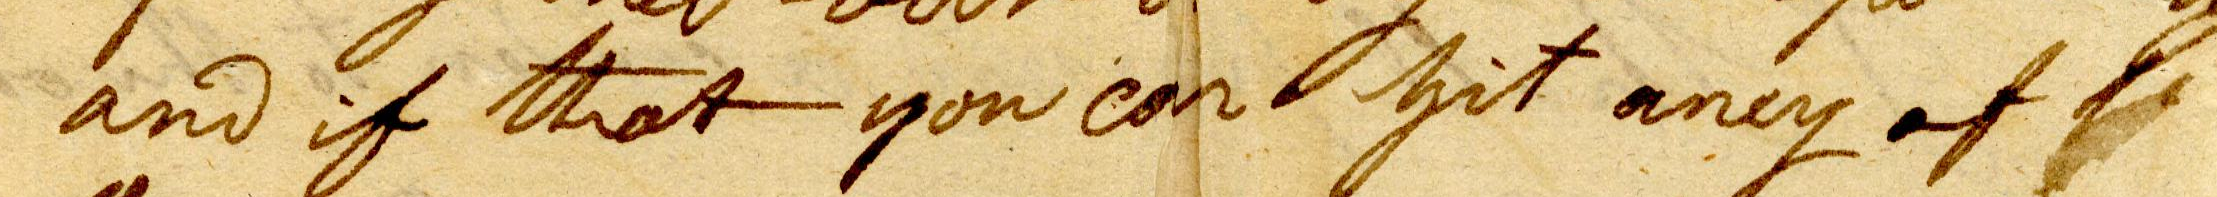and if that you can git aney of [_]
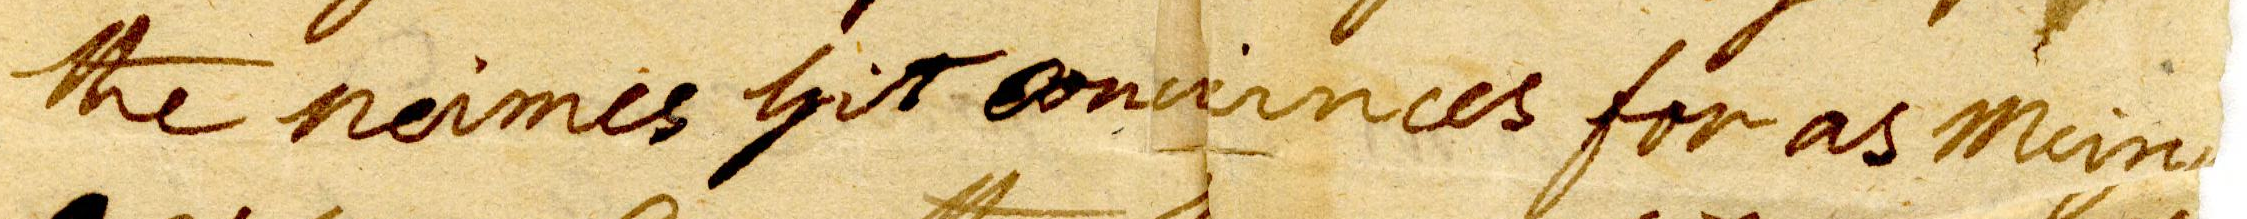the neimes git conveinces for as mein
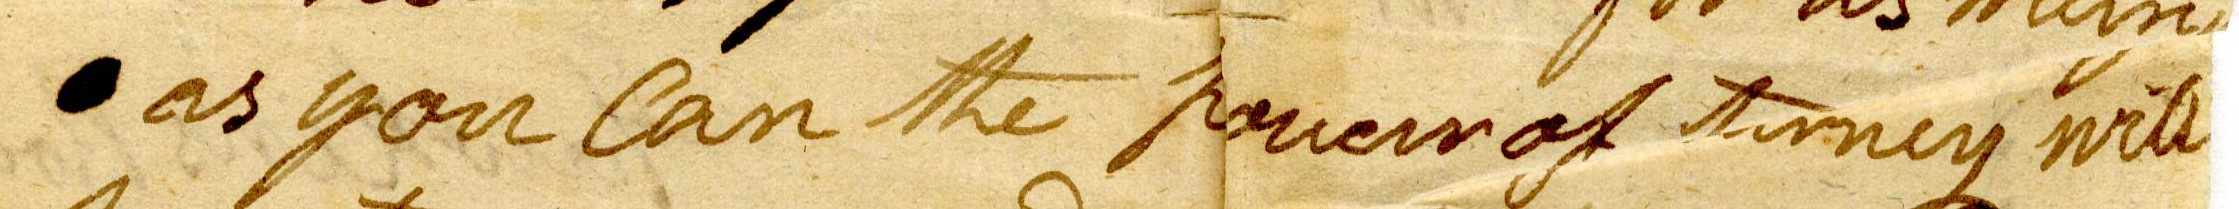as you can the power of turney will
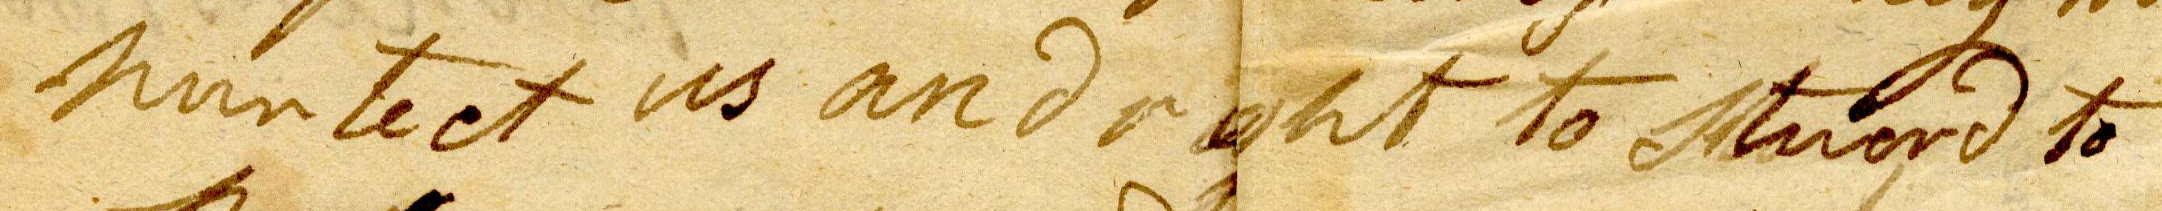purtect us and right to stuord to
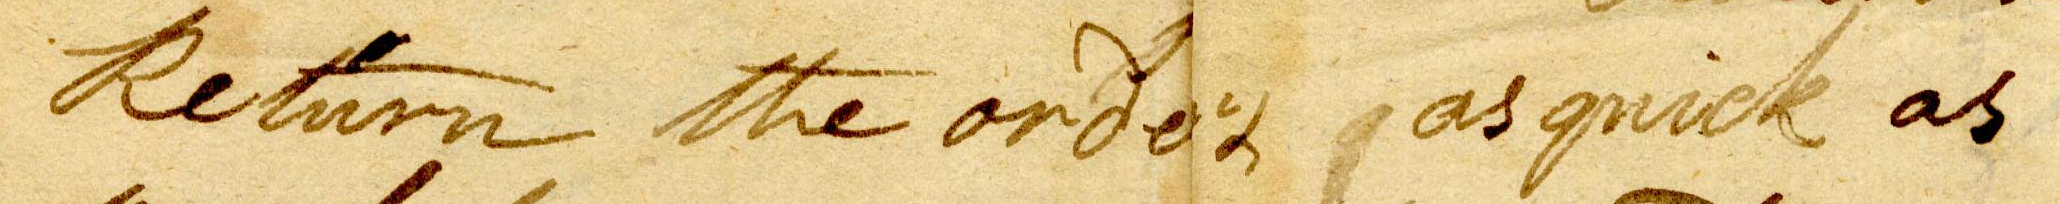Return the order as quick as
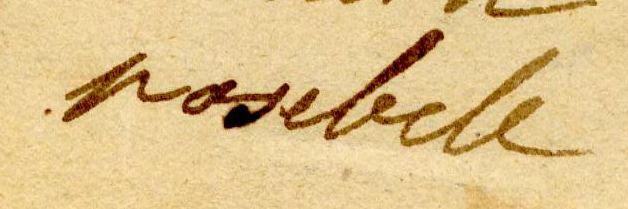posebele
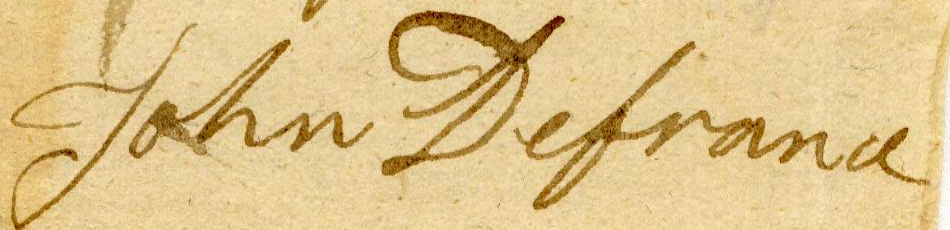John Defrance
